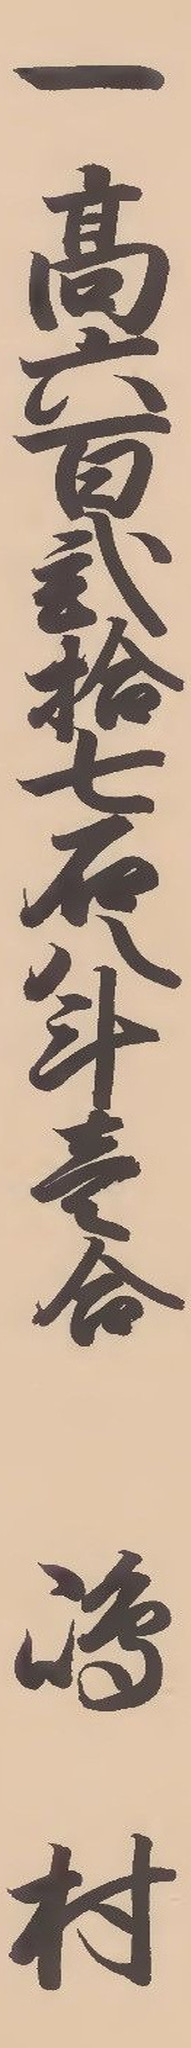一高六百弐拾七石八斗壱合嶋村
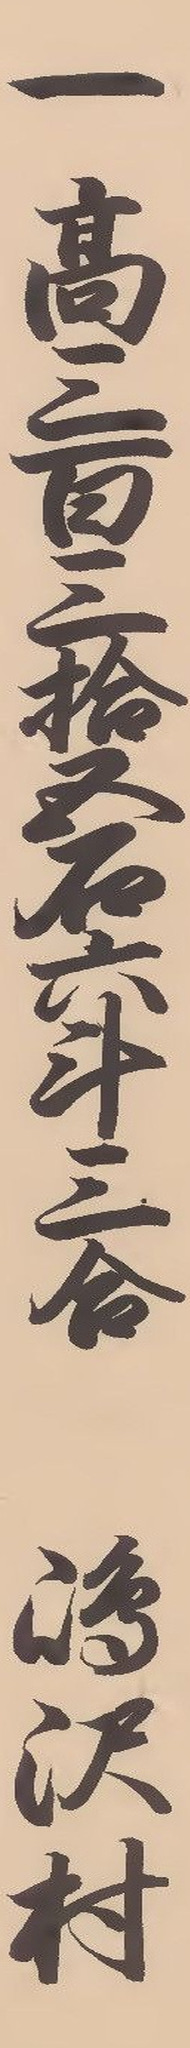一高三百三拾五石六斗三合嶋沢村
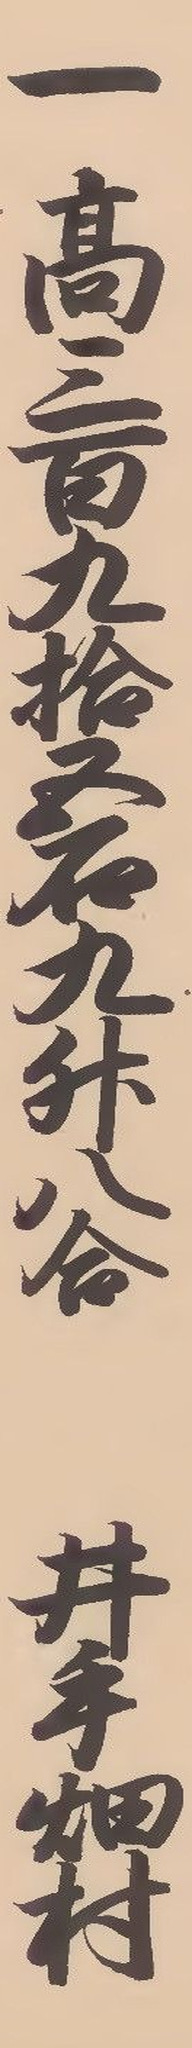一高三百九拾五石九升八合井手畑村

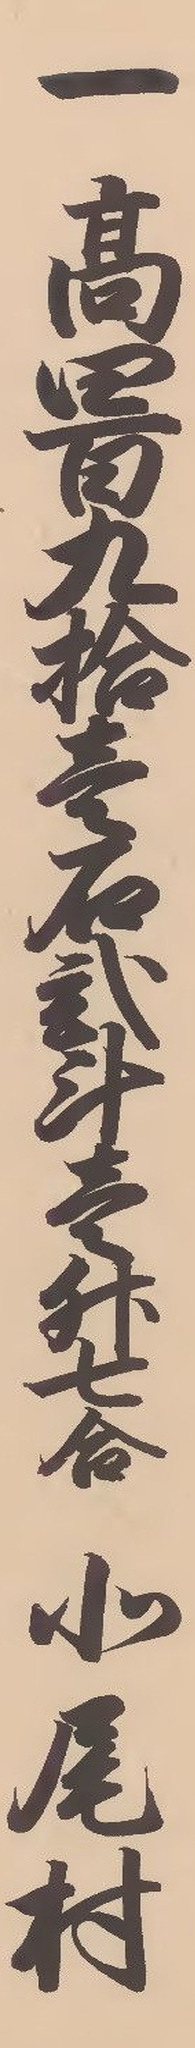一高四百九拾壱石弐斗壱升七合北尾村
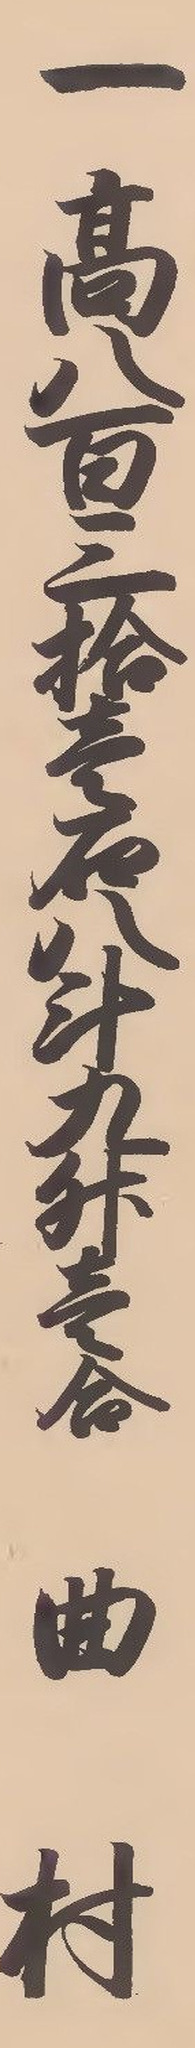一高八百三拾壱石八斗九升壱合曲村
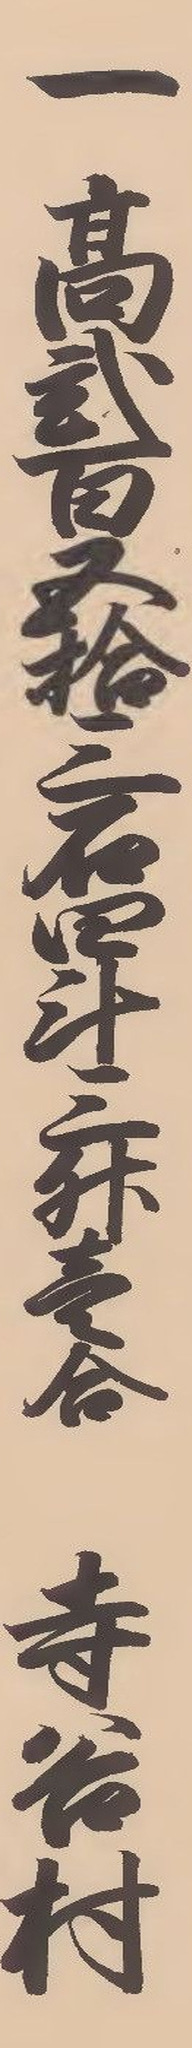一高弐百五拾三石四斗三升壱合寺谷村
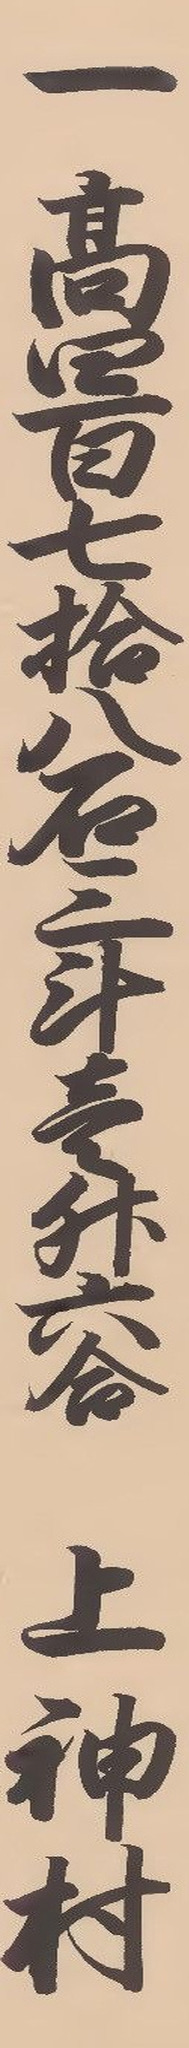一高四百七拾八石三斗壱升六合上神村
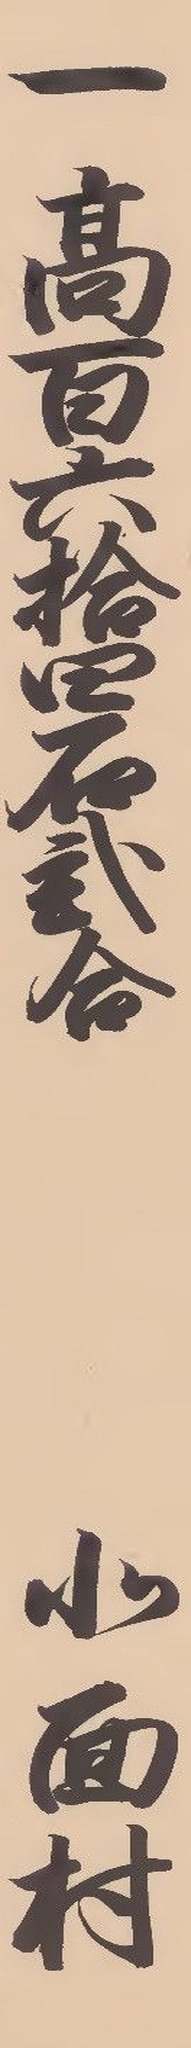一高百六拾四石弐合北面村
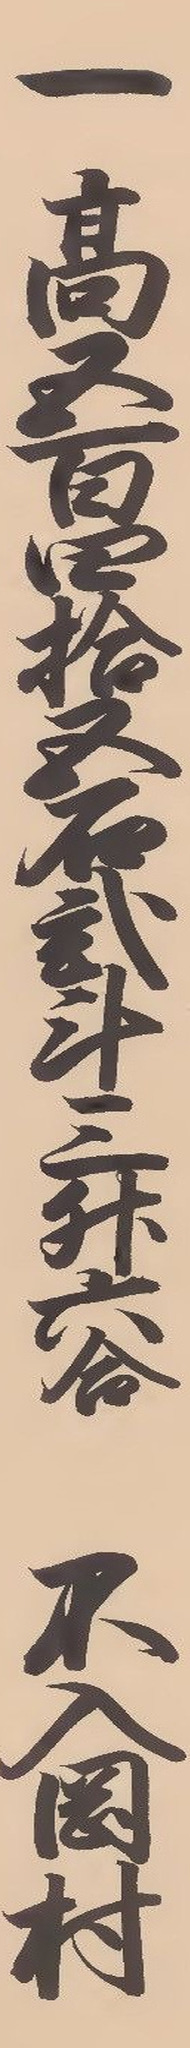一高五百四拾五石弐斗三升六合不入岡村
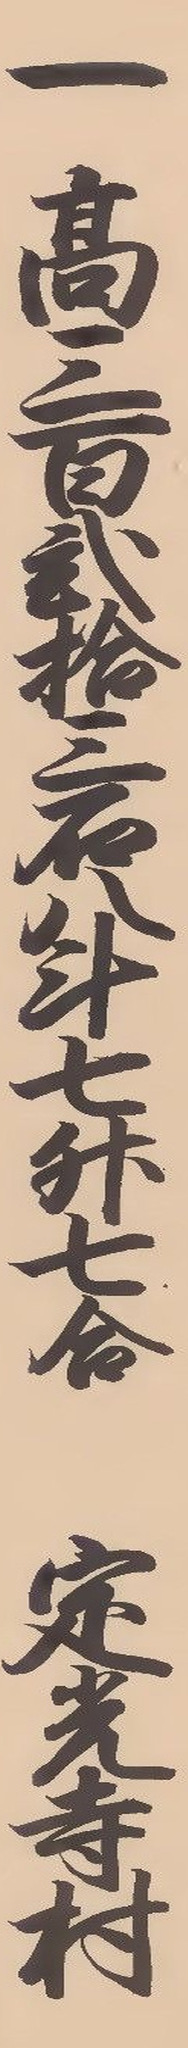一高三百弐拾三石八斗七升七合定光寺村

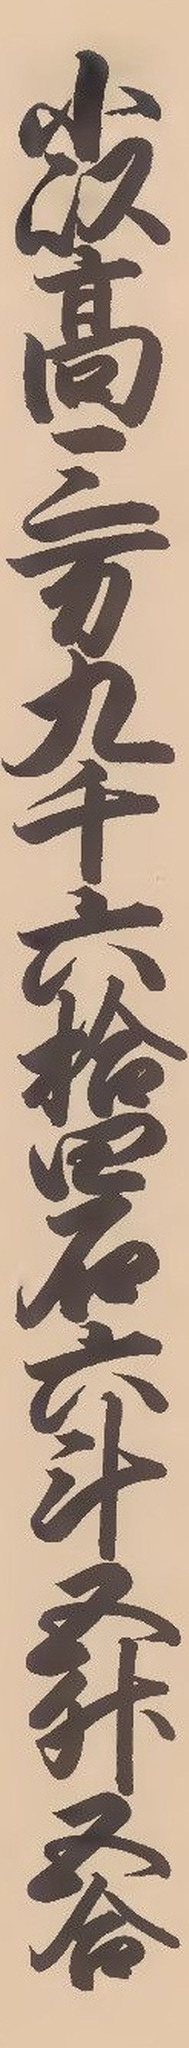小以高三万九千六拾四石六斗五升五合
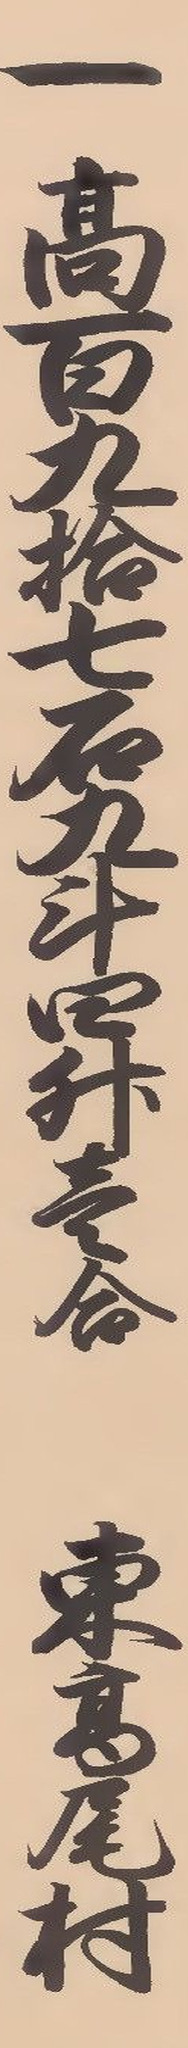一高百九拾七石九斗四升壱合東高尾村
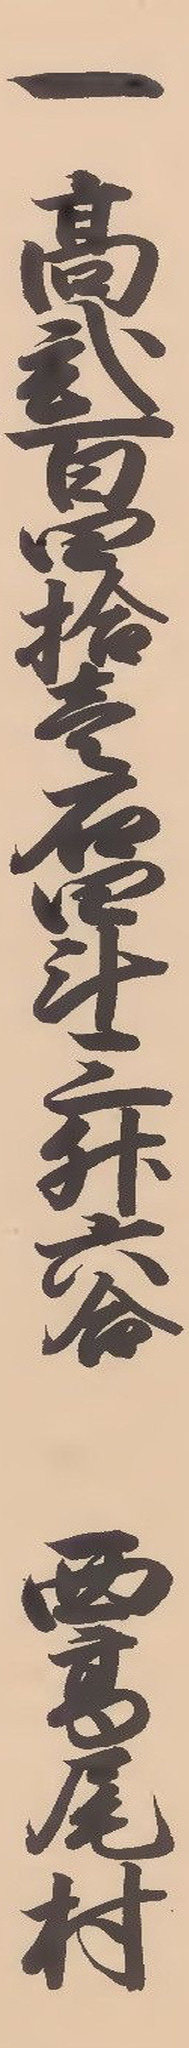一高弐百四拾壱石四斗三升六合西高尾村
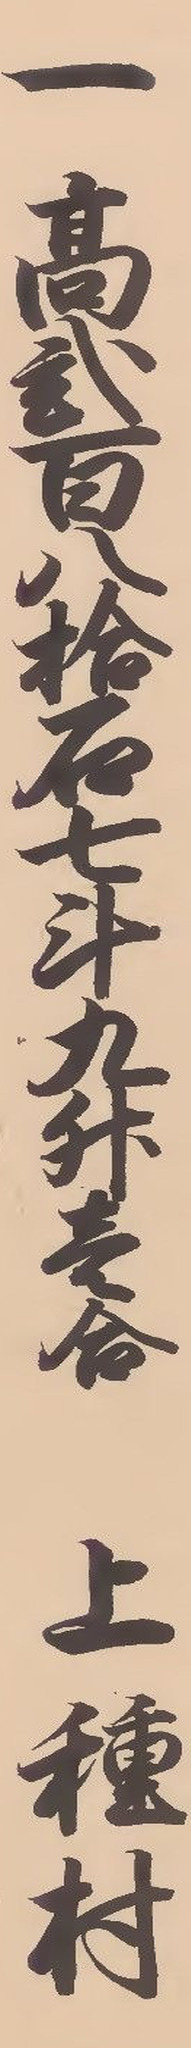一高弐百八拾石七斗九升壱合上種村

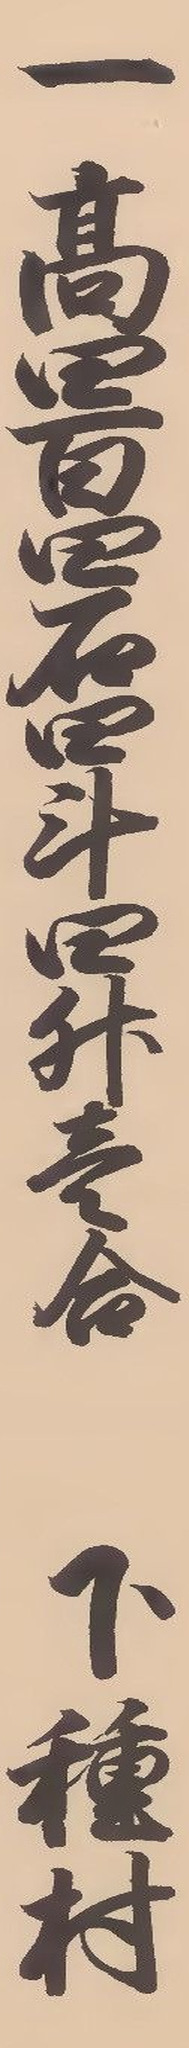一高四百四石四斗四升壱合下種村
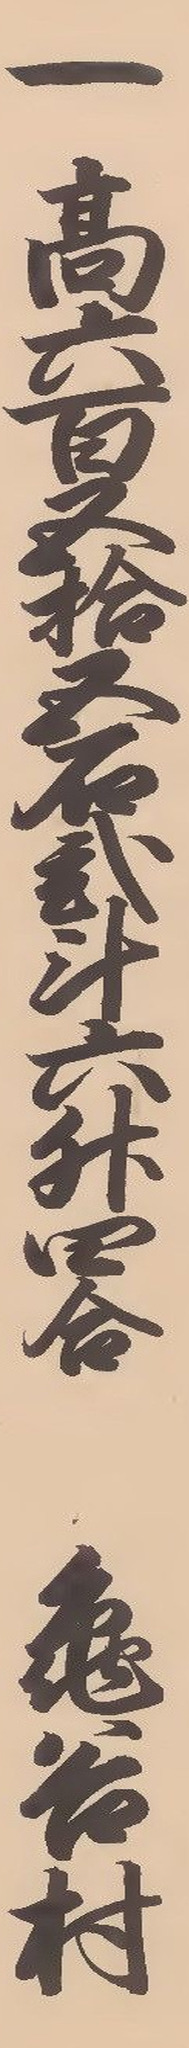一高六百五拾五石弐斗六升四合亀谷村
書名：伯耆国郷帳
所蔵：国立公文書館 National Archives of Japan
